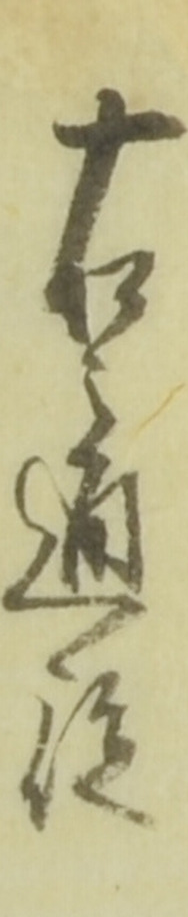右之通従
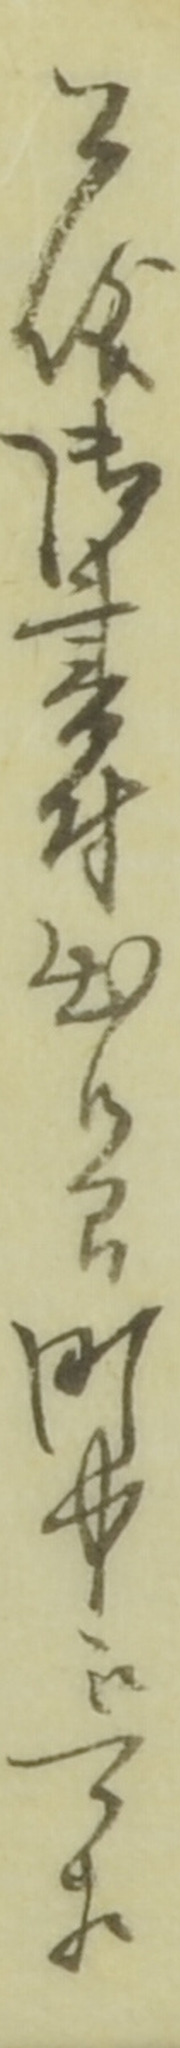公儀御書付出候間町中江可相
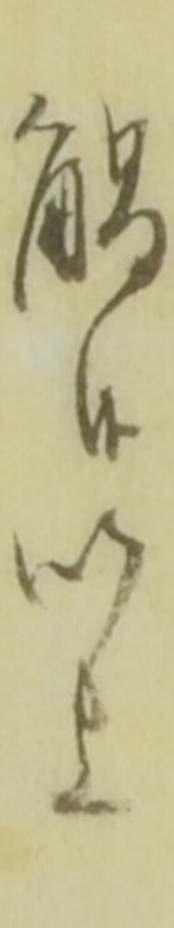触候以上
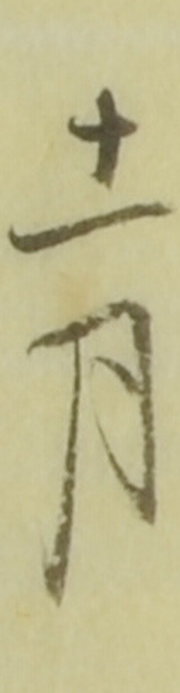十一月
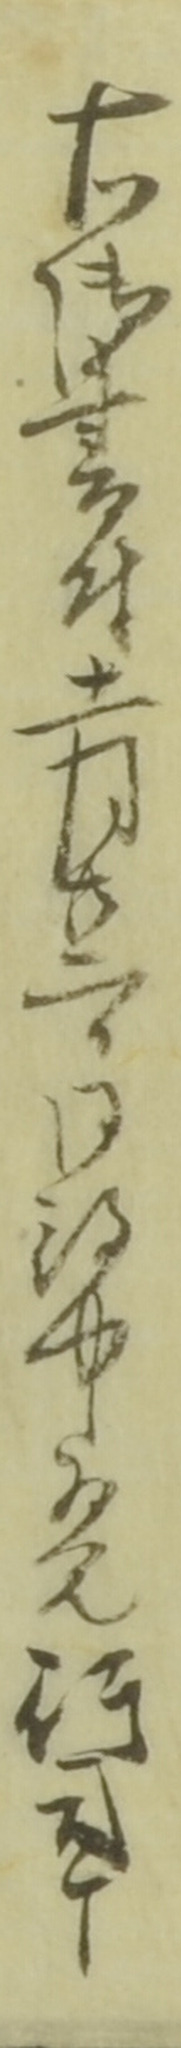右御書付十一月廿ニ日同役中為見行司丁
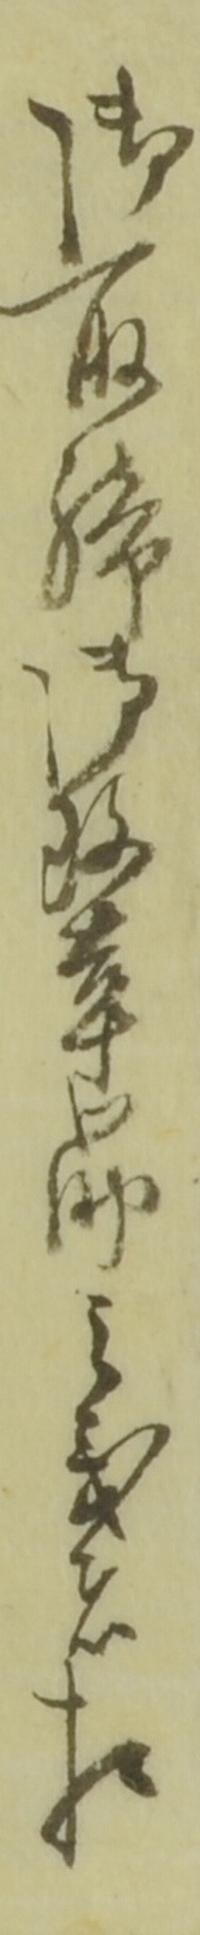御取締御改革筋之義者相
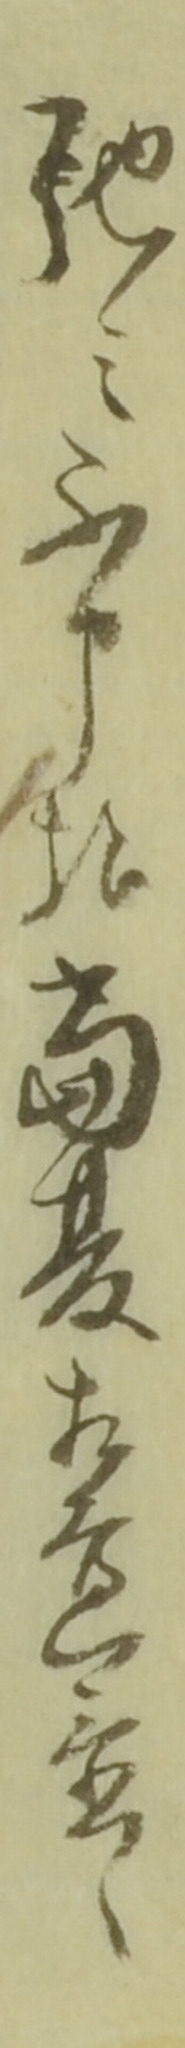馳之不申様当夏相辺置候
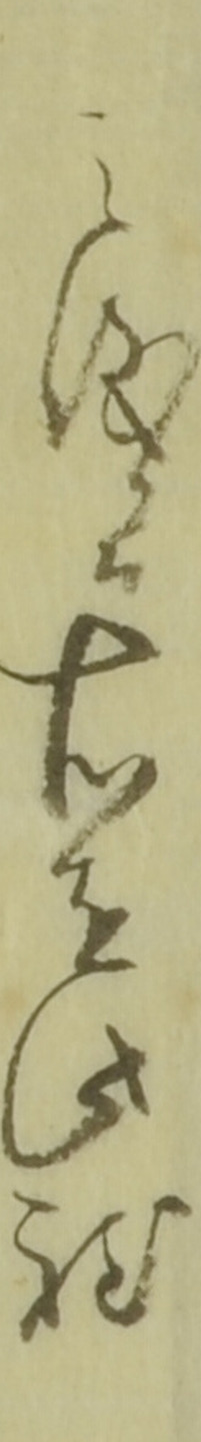之儀ニ而右者此程
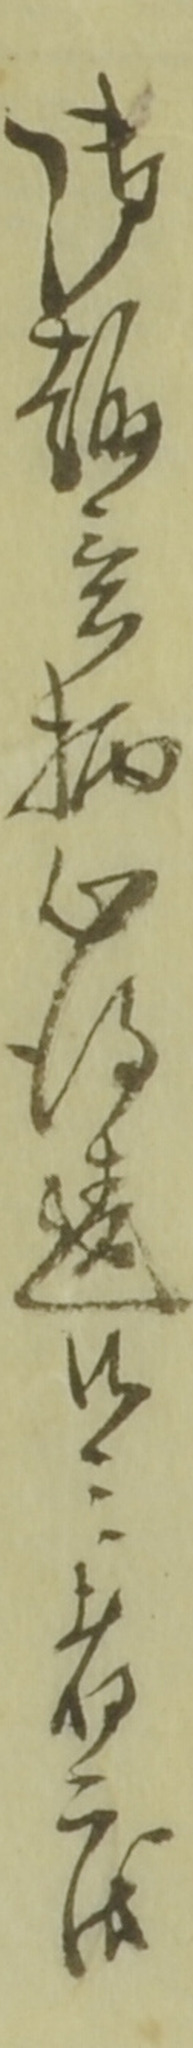御趣意柄心得違候之者茂
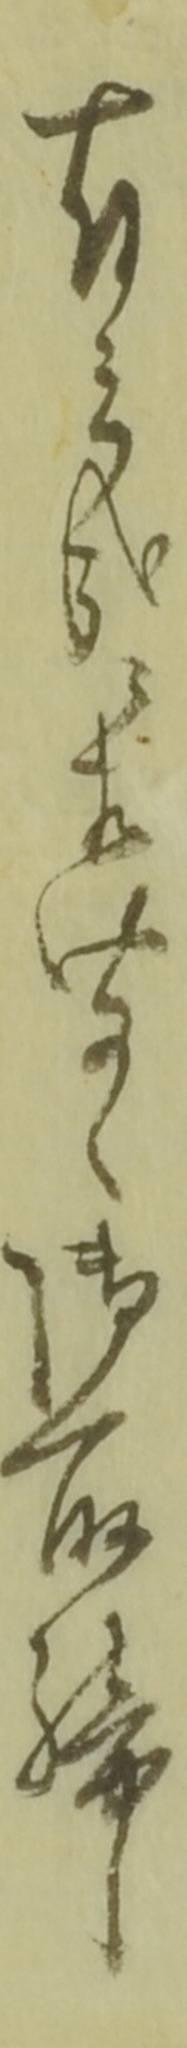有之哉ニ相聞候御取締候
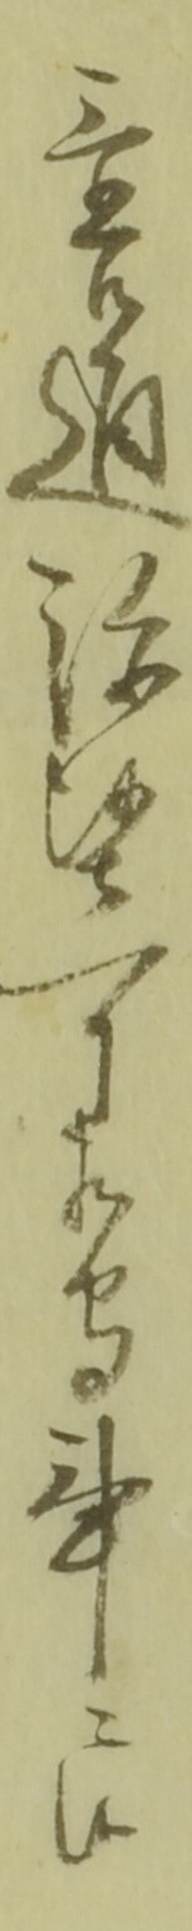置候通弥堅可相守事ニ候
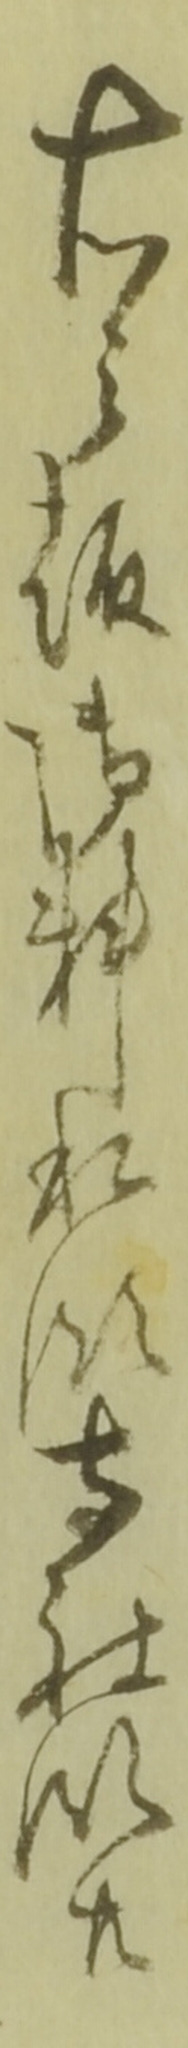右之趣御料私領寺社領共
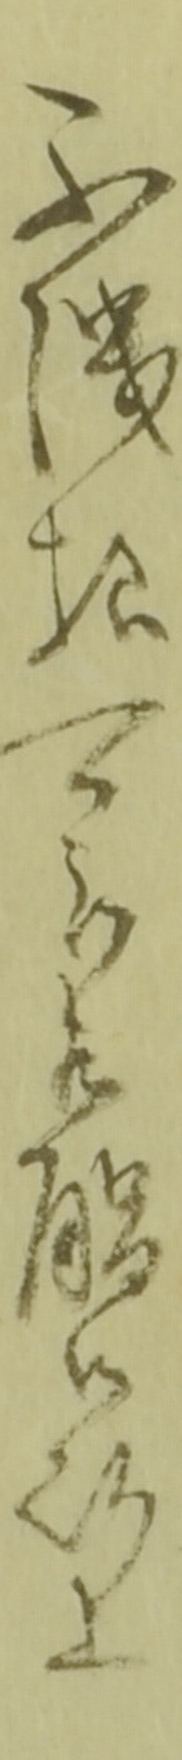不洩様可被相触候以上
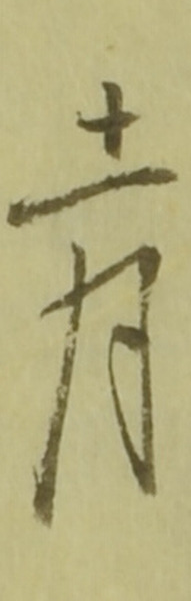十一月
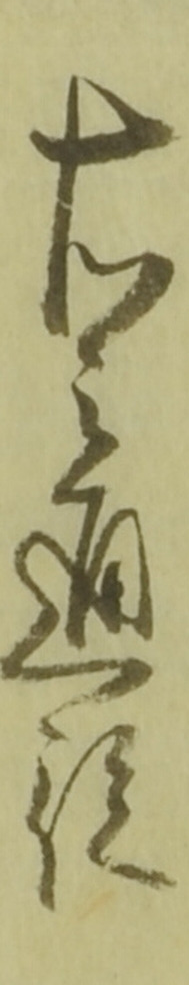右之通従
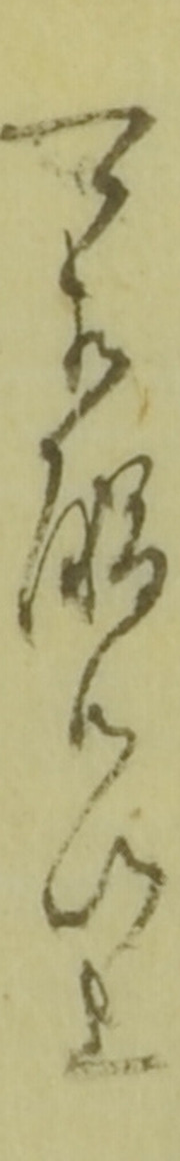可相触候以上
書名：御触書御書附控
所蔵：伊那市立高遠町図書館・合同会社AMANE
